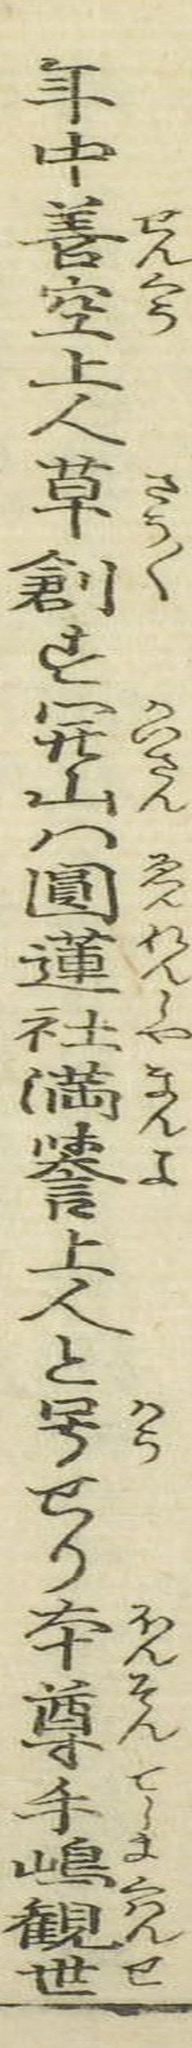年中善空上人草創す開山は円蓮社満誉上人と号せり本尊手嶋観世
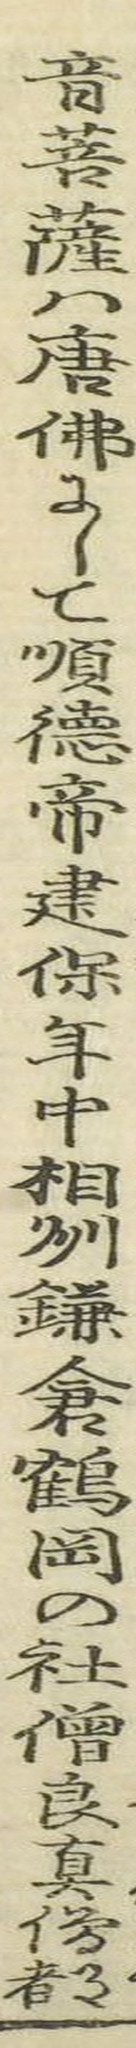音菩薩は唐仏にして順徳帝建保年中相州鎌倉鶴岡の社僧良真僧都
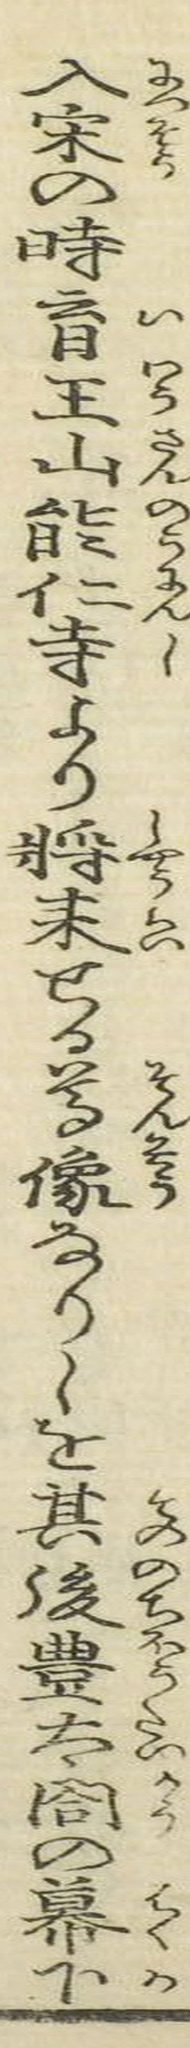入宋の時育王山能仁寺より将来せる尊像なりしを其後豊太閤の幕下
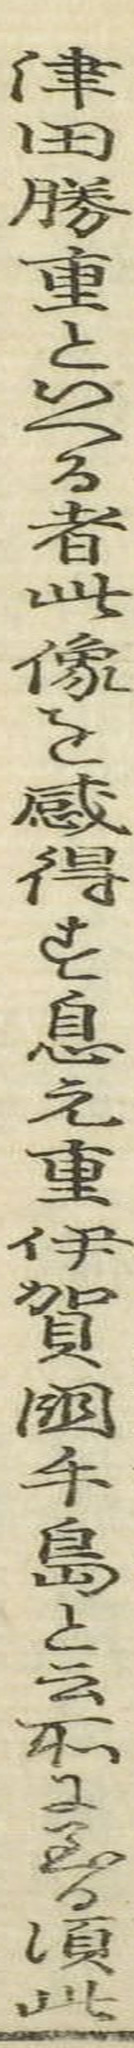津田勝重といへる者此像を感得す息元重伊賀国手島と云所に至る頃此
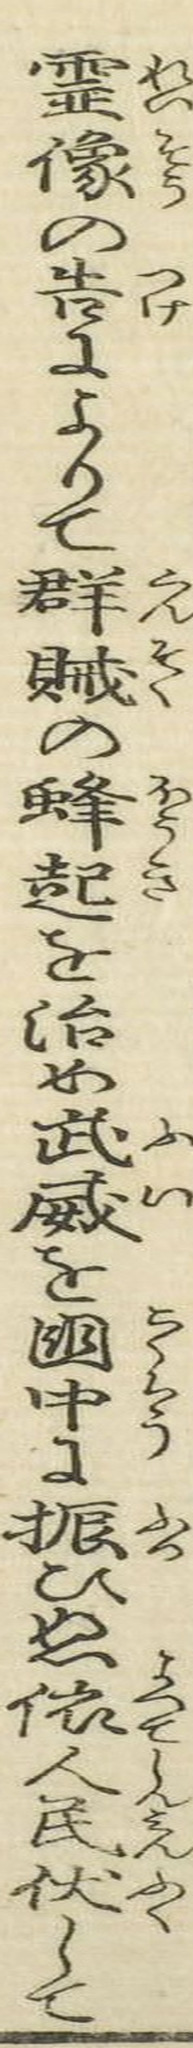霊像の告によりて群賊の蜂起を治め武威を国中に振ひぬ依人民伏して
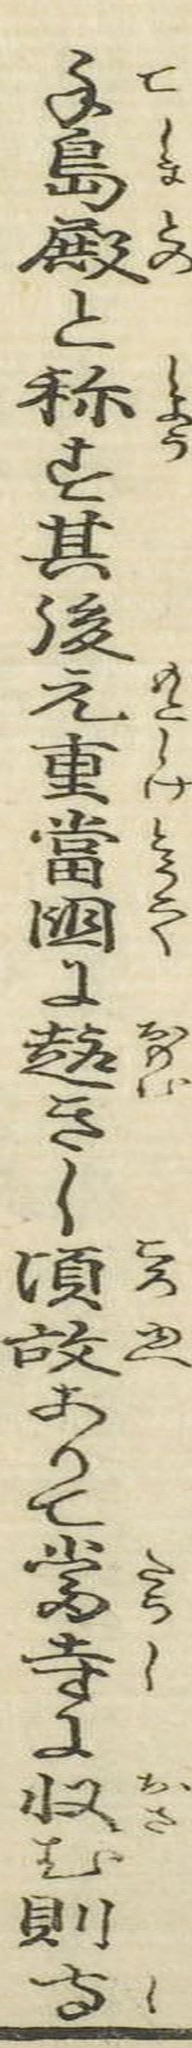手島殿と称す其後元重当国に趣きし頃故ありて当寺に収む則寺
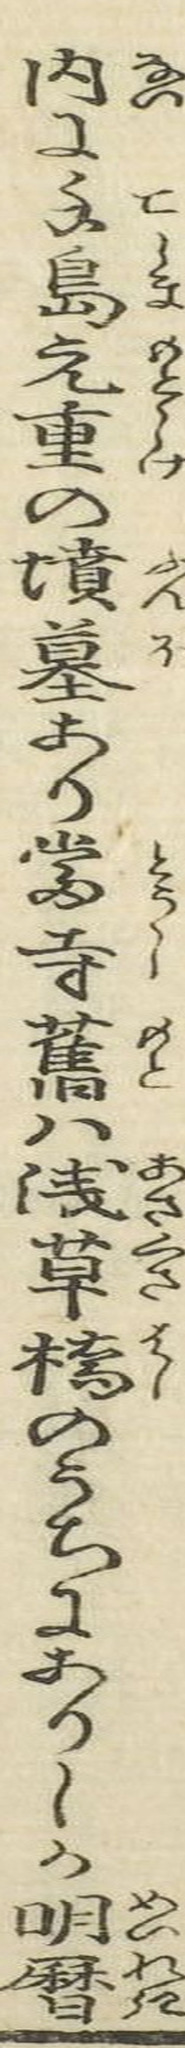内に手島元重の墳墓あり当寺旧は浅草橋のうちにありしか明暦
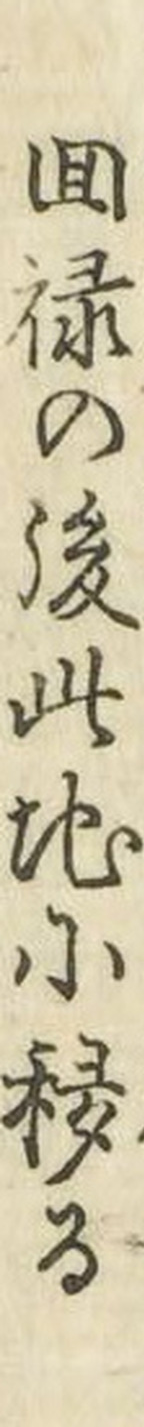回禄の後此地に移る
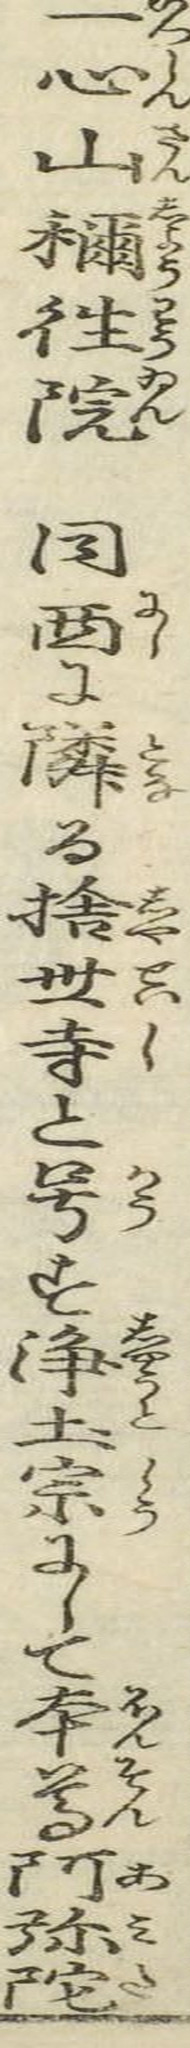一心山称往院同西に隣る捨世寺と号す浄土宗にして本尊阿弥陀
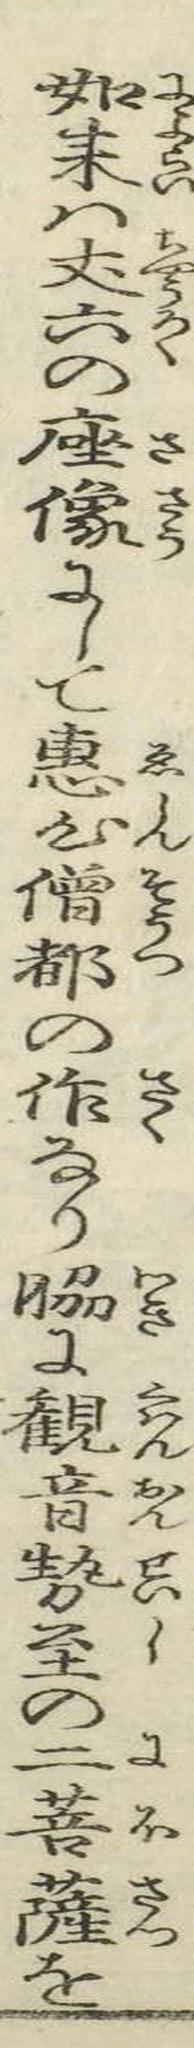如来は丈六の座像にして恵心僧都の作なり脇に観音勢至の二菩薩を
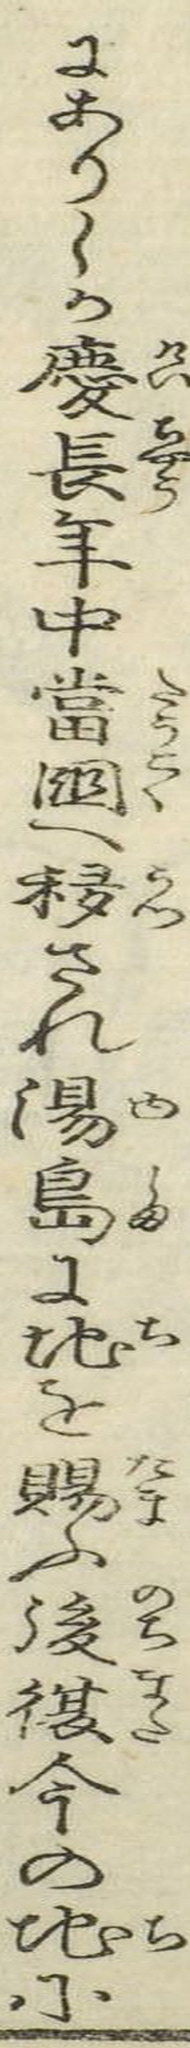にありしか慶長年中当国へ移され湯島に地を賜ふ後復今の地に
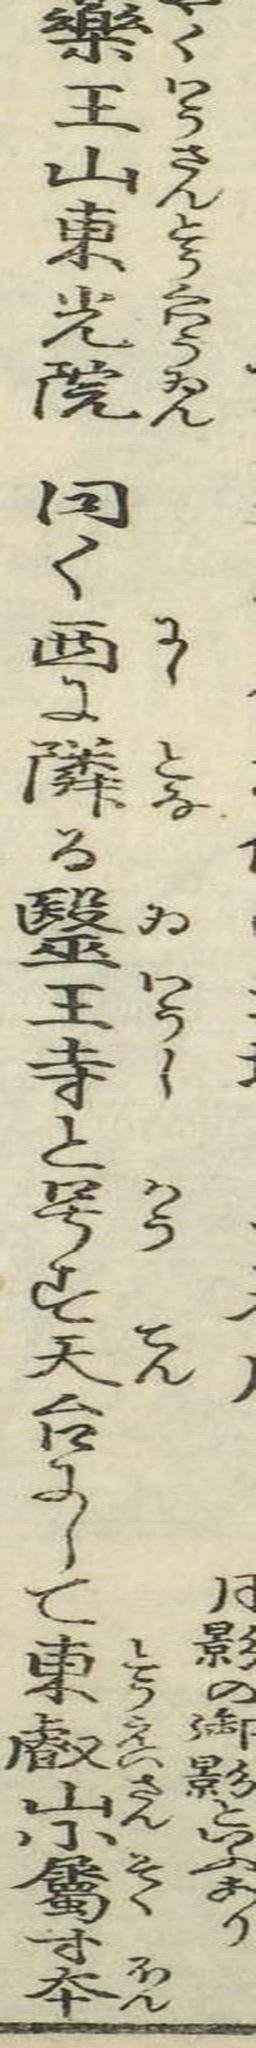薬王山東光院同く西に隣る医王寺と号す天台にして東叡山に属す本
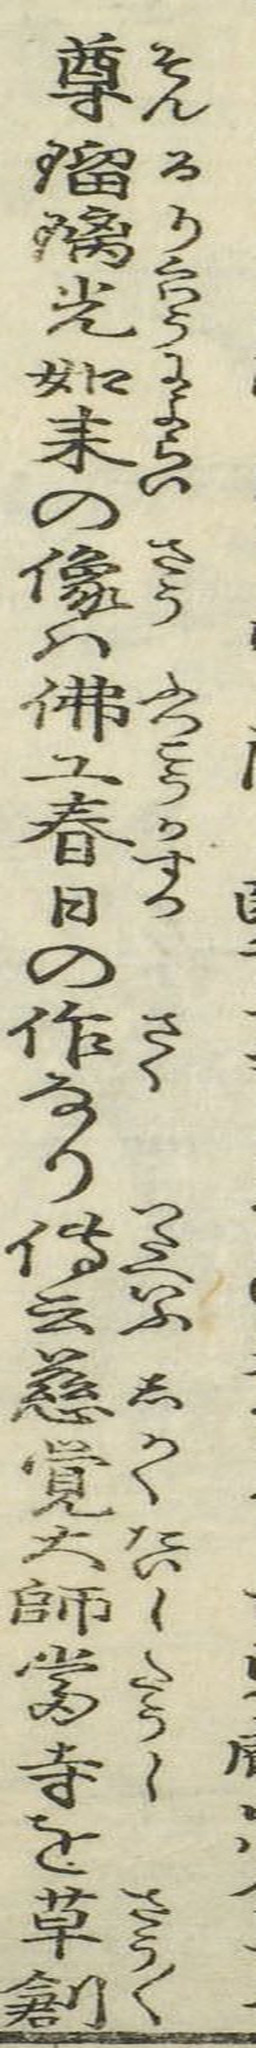尊瑠璃光如来の像は仏工春日の作なり伝云慈覚大師当寺を草創
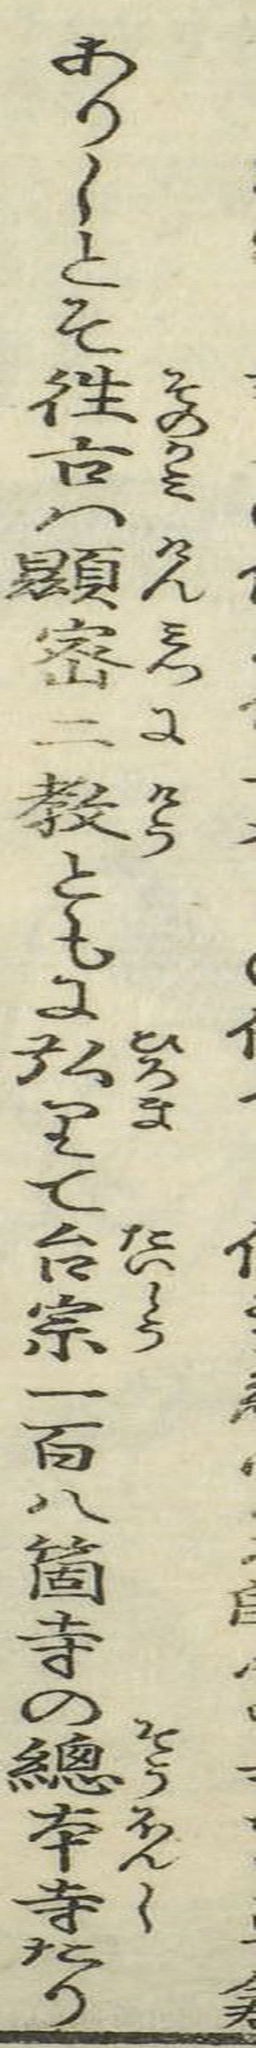ありしとそ往古は顕密二教ともに弘りて台宗一百八箇寺の総本寺たり
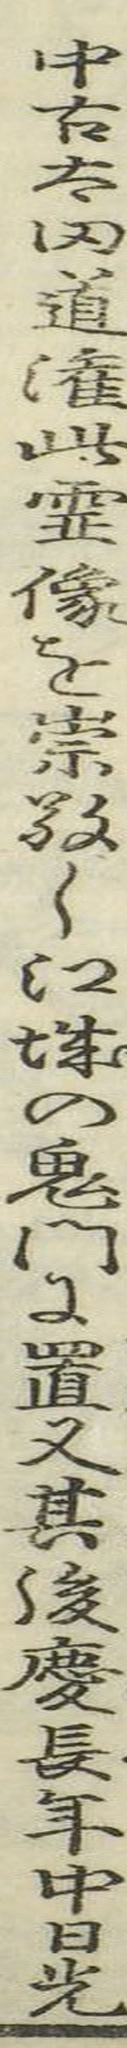中古太田道灌此霊像を崇敬し江城の鬼門に置又其後慶長年中日光
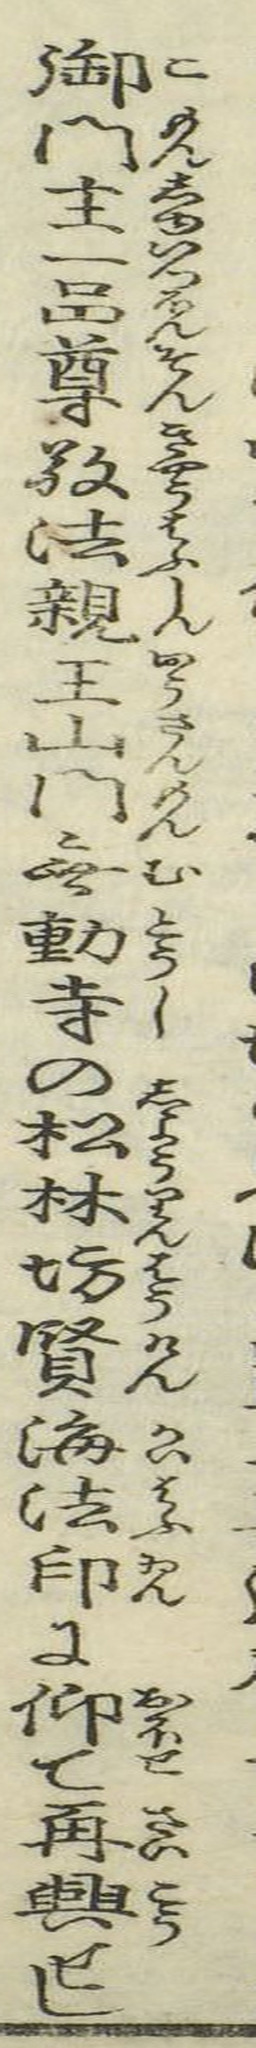御門主一品尊敬法親王山門無動寺の松林坊賢海法印に仰て再興せし
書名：江戸名所図会 20巻 巻之16
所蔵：東京学芸大学教育コンテンツアーカイブ
